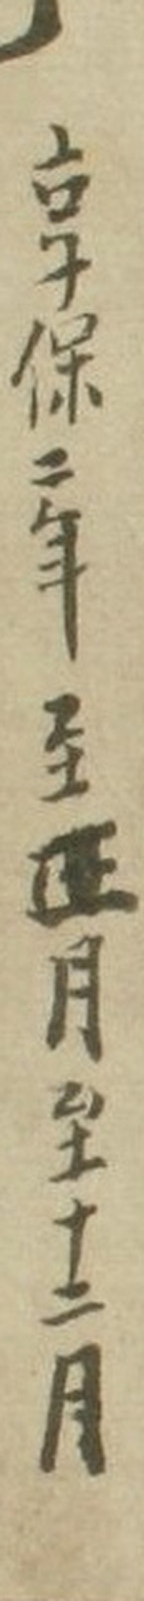享保二年至正月至十二月

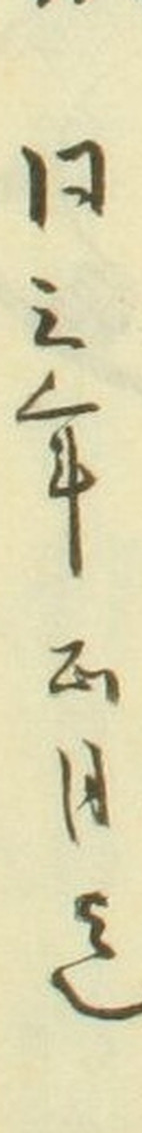同三年正月迄

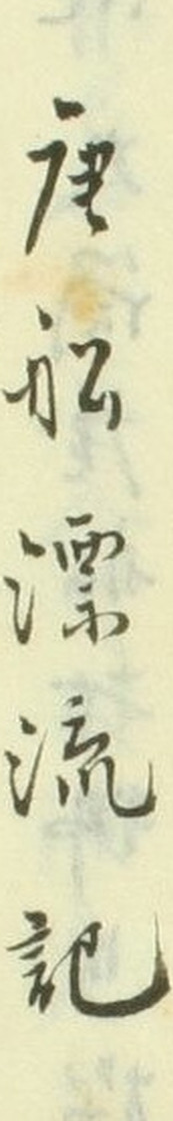唐船漂流記
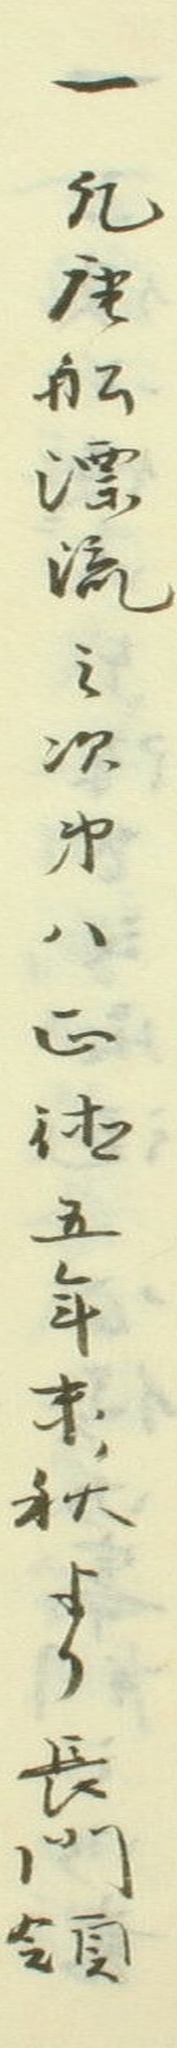一左唐船漂流之次第ハ正徳五年末秋より長門領
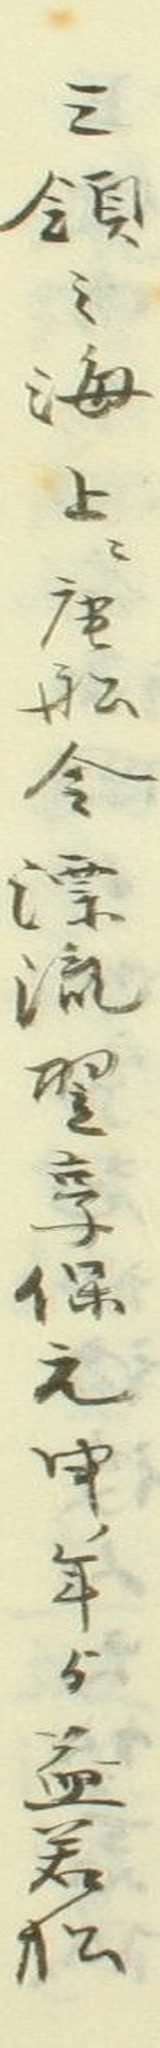之領之海上二唐松令漂流聖享保之申ノ年ら益若松
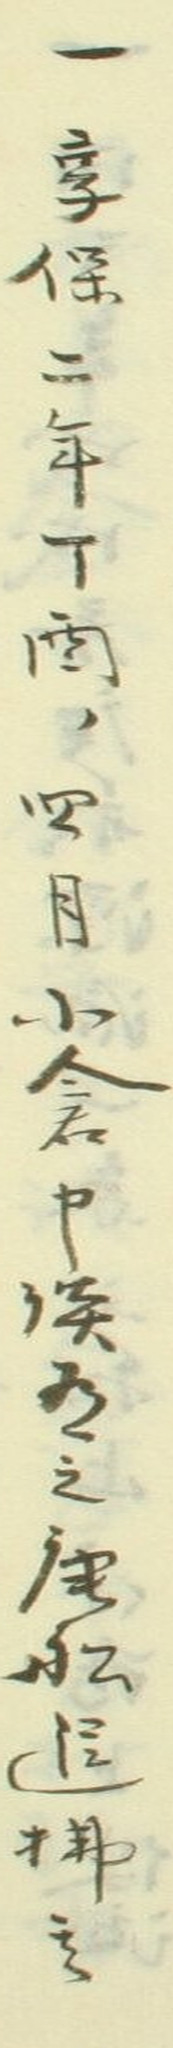一享保二年丁酉の四月小倉申談有之唐船追払其
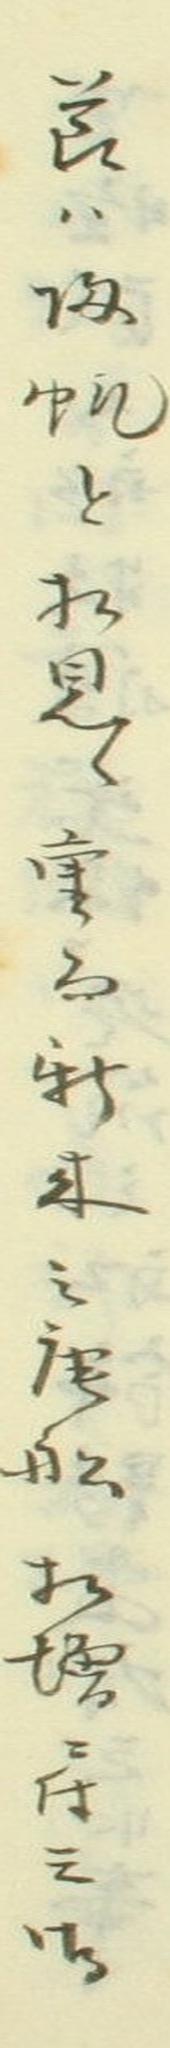節は帰帆と相見候重而新来之唐船相増に付三御
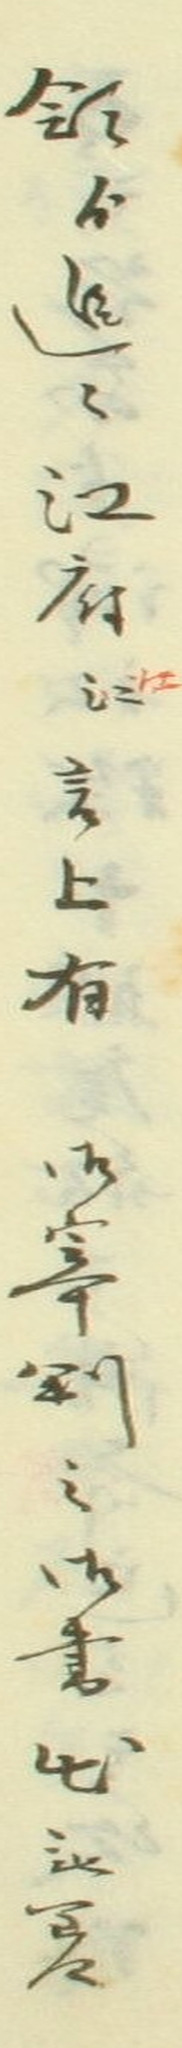領ゟ追々江府江言上有御寄判之御書出被着

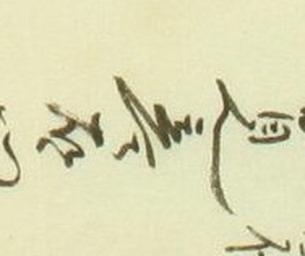勝野惣太夫
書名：唐船漂流記 一
